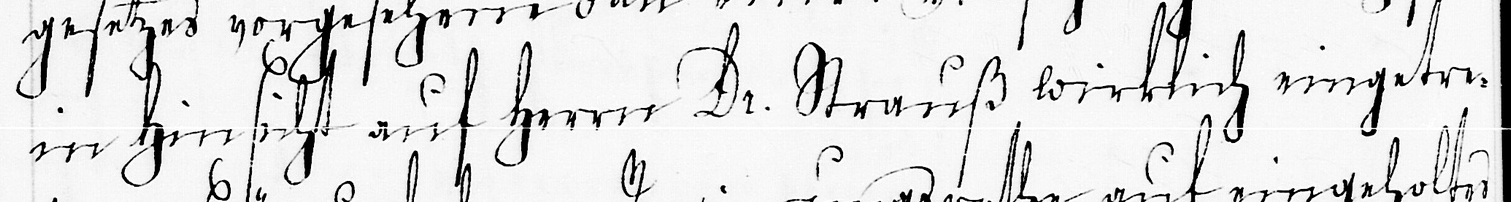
in Hinsicht auf Herrn Dr. Strauß wirklich eingetre¬
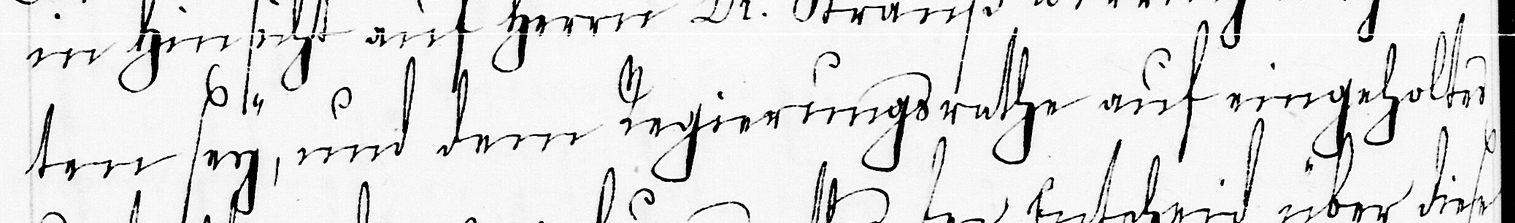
ten sey, und dem Regierungsrathe auf eingeholtes
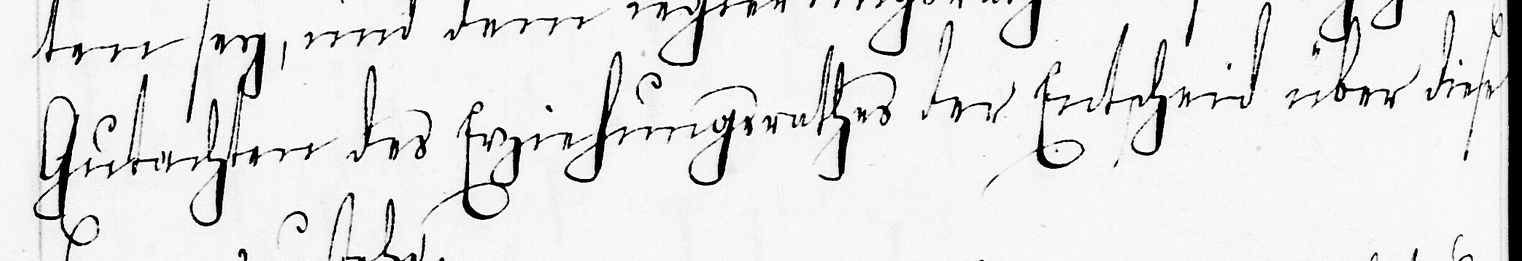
Gutachten des Erziehungsrathes der Entscheid über diese
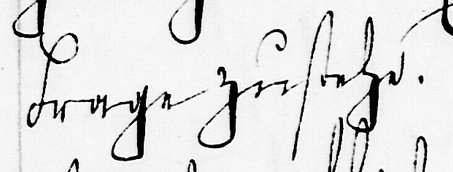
Frage zustehe.
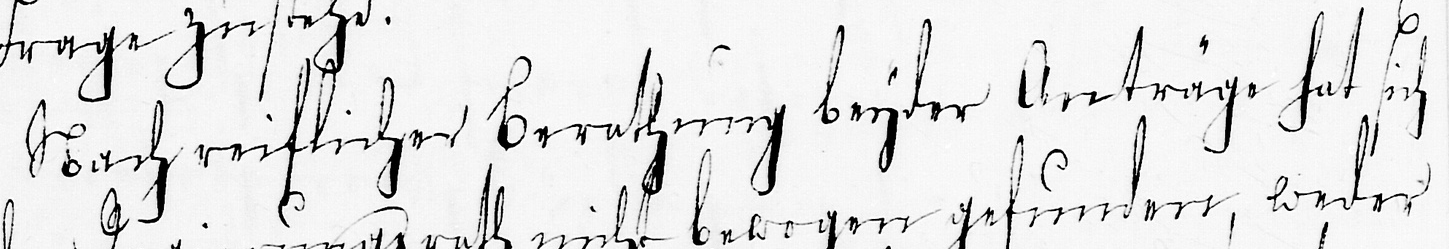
Nach reiflicher Berathung beyder Anträge hat si¬
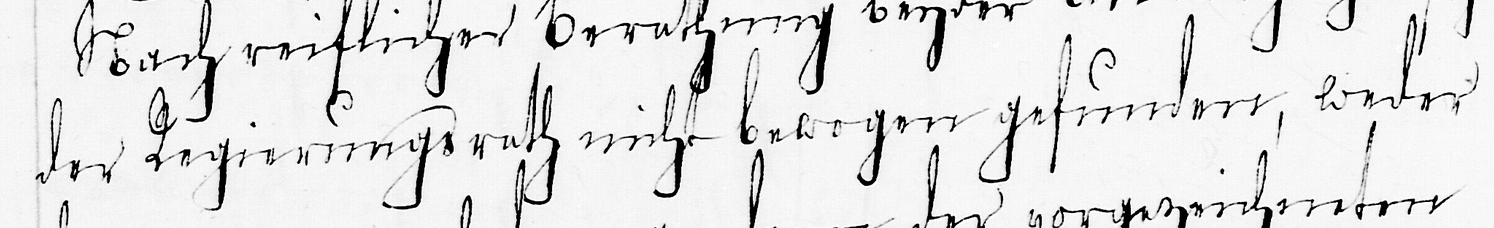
der Regierungsrath nicht bewogen gefunden, weder
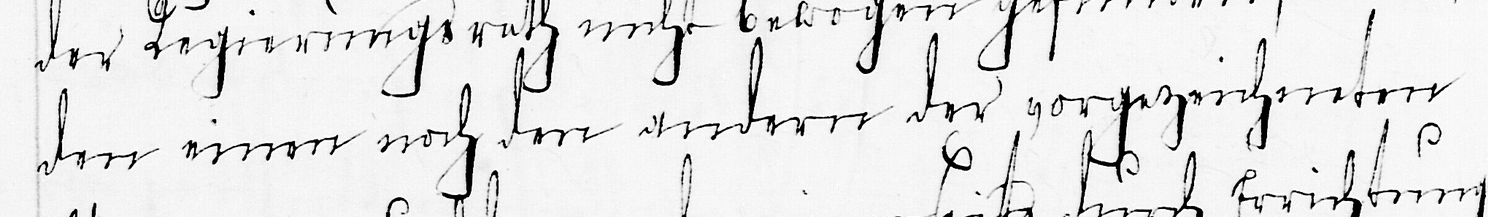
den einen noch den andern der vorgezeichneten
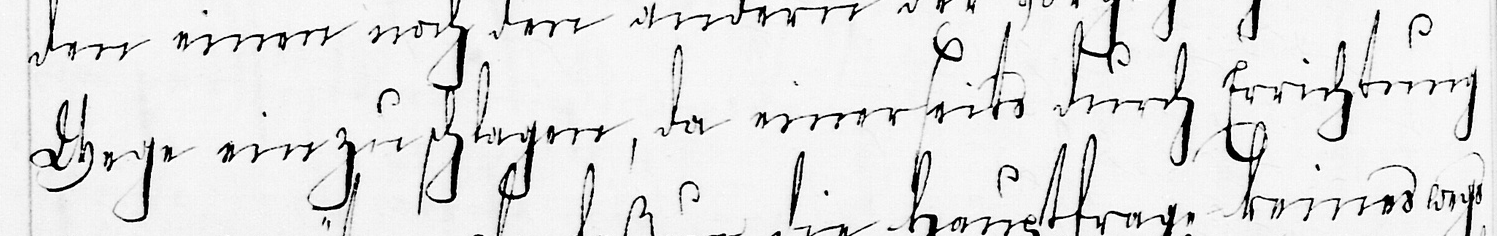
Wege einzuschlagen, da einerseits durch Errichtung
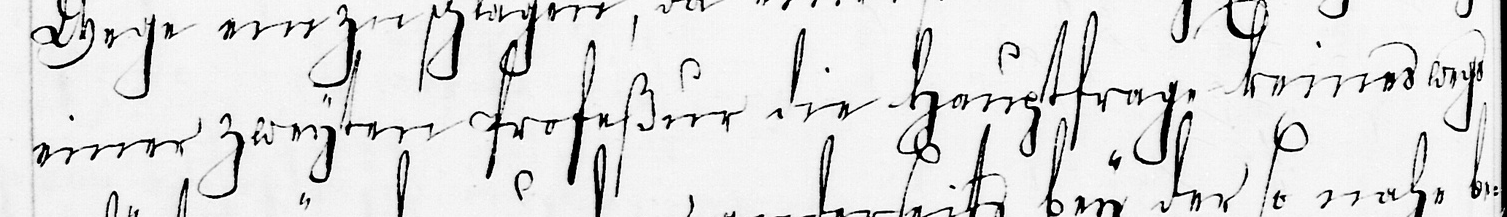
einer zweyten Profeßur die Hauptfrage keineswegs
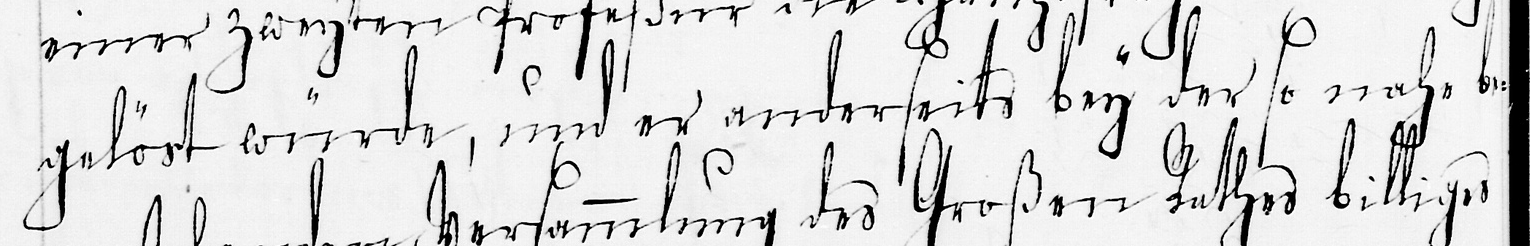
gelöst würde, und er anderseits bey der so nahe be¬
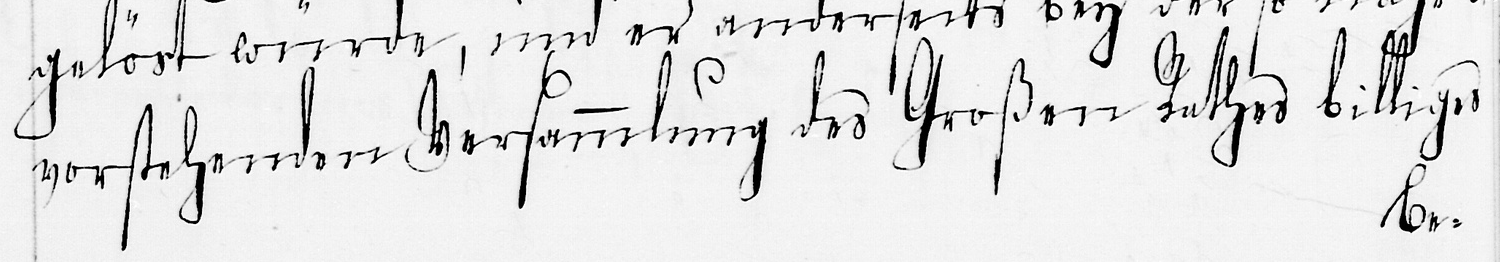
vorstehenden Versammlung des Großen Rathes billig¬
